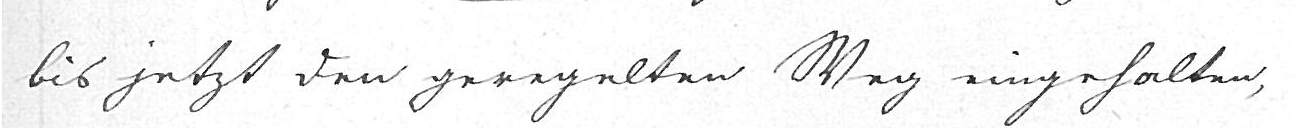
bis jetzt den geregelten Weg eingehalten,
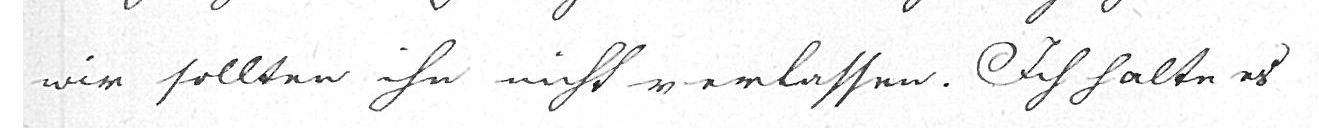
wir sollten ihn nicht verlassen. Ich halte es
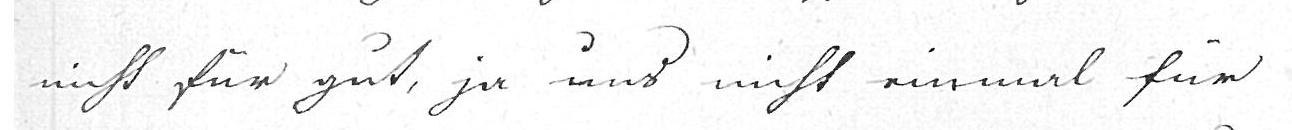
nicht für gut, ja uns nicht einmal für
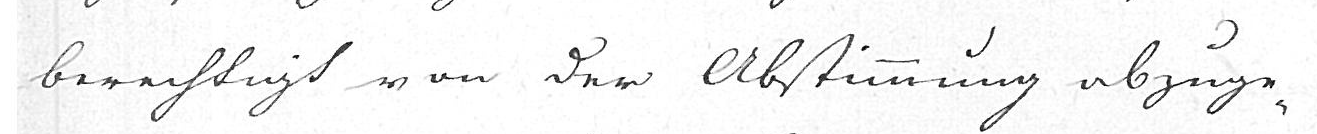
berechtigt von der Abstimmung abzuge-
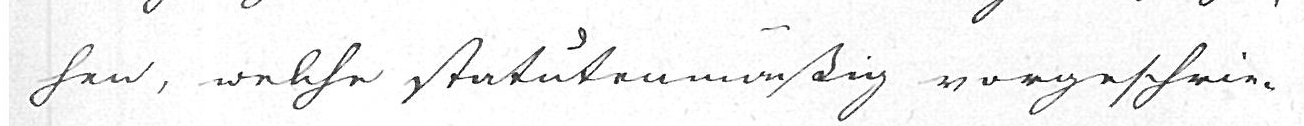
hen, welche statutenmäßig vorgeschrie-
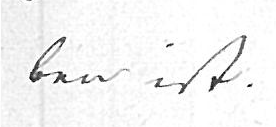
ben ist.
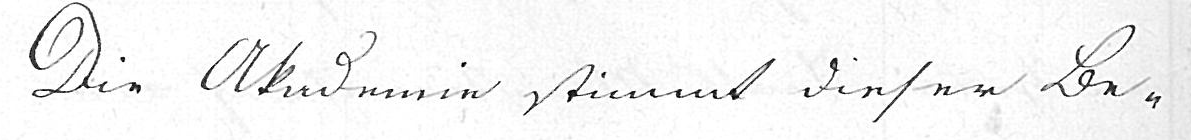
Die Akademie stimmt dieser Be-
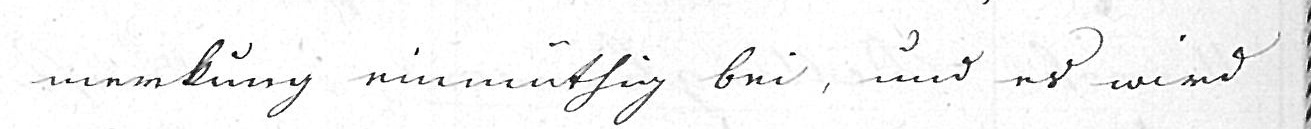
merkung einmüthig bei, und es wird
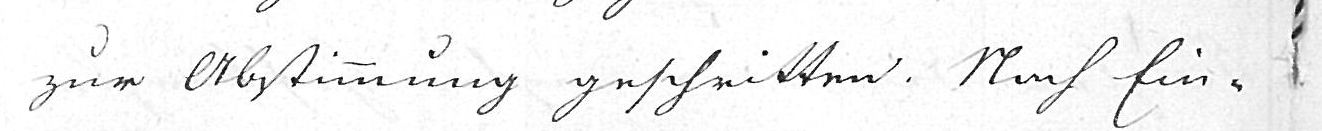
zur Abstimmung geschritten. Nach Ein-
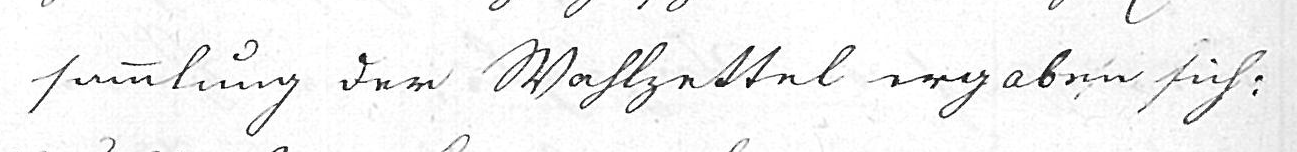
sammlung der Wahlzettel ergaben sich:
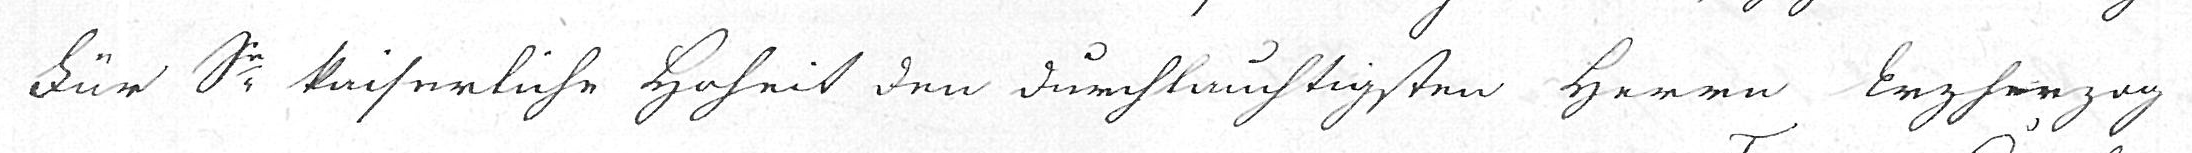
Für Sr. kaiserliche Hoheit den durchlauchtigsten Herrn Erzherzog
